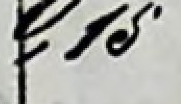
0,15
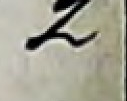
2
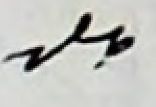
do
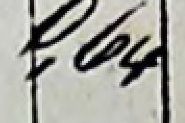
0,64
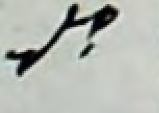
do
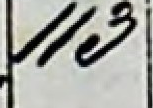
113
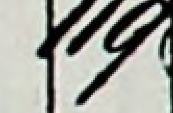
119
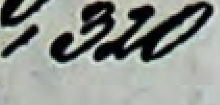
0,320
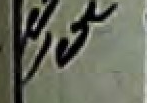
3,5
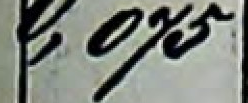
0,075
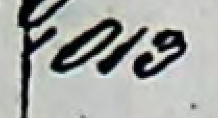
0,013
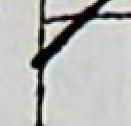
7
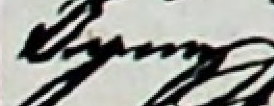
Ignaz
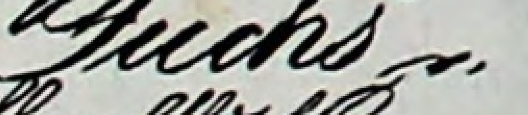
Fuchs v.
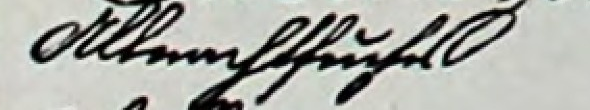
Altanchtfuches
